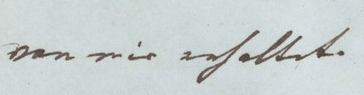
von mir erhaltet.
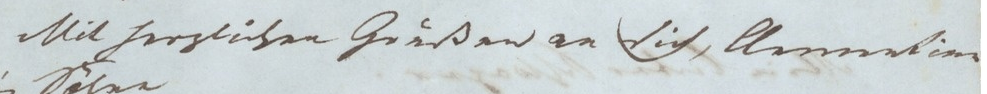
Mit herzlichen Grüßen an dich, Clementine
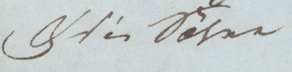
& die Söhne
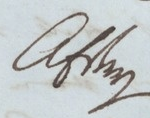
Bern
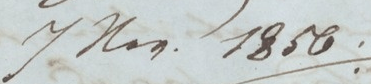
7 Nov. 1850.
